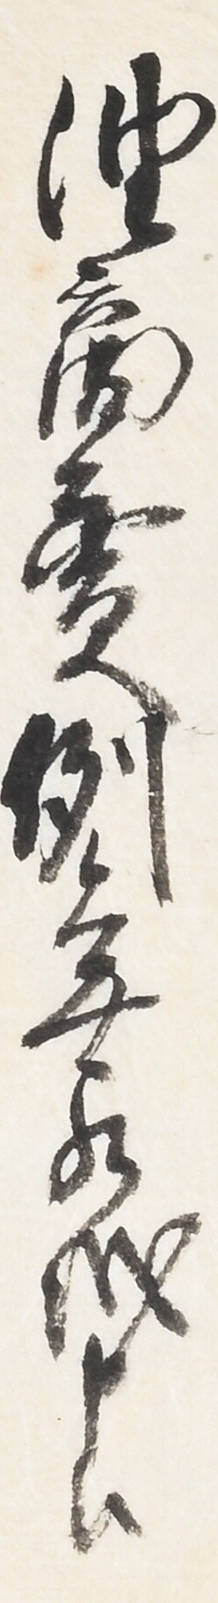油商売例年罷越申候
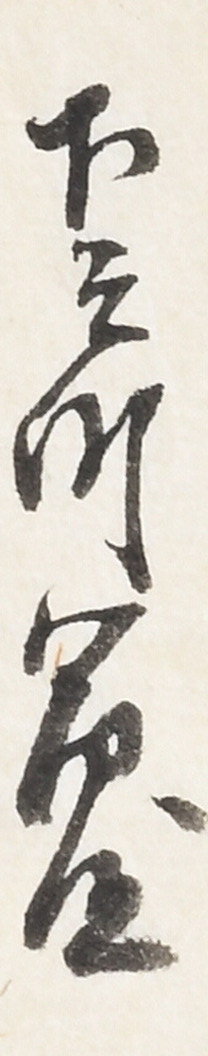下モ町冨屋
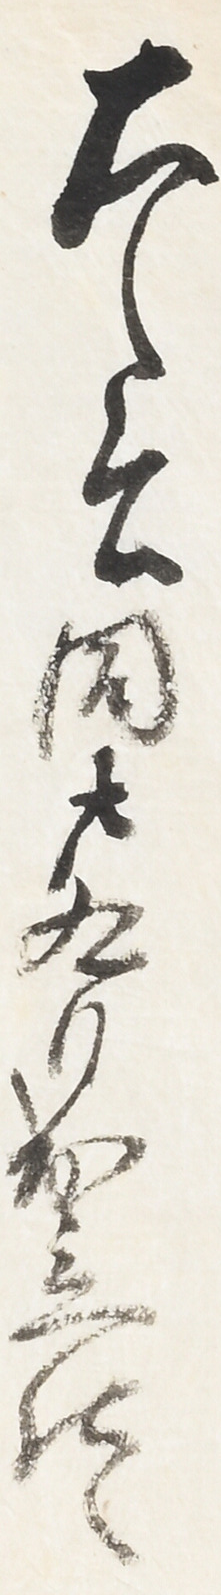右之者同廿ク日出立仕候
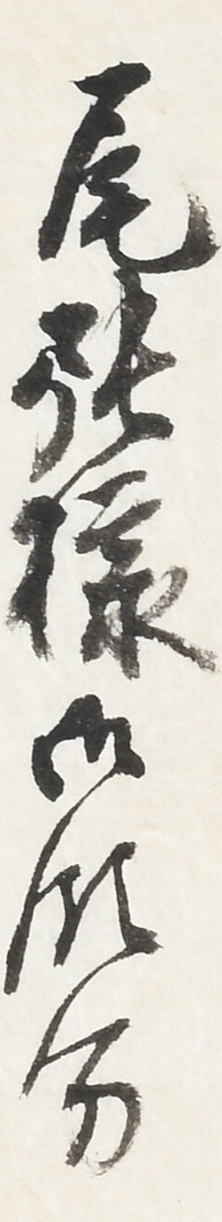尾張様御領分
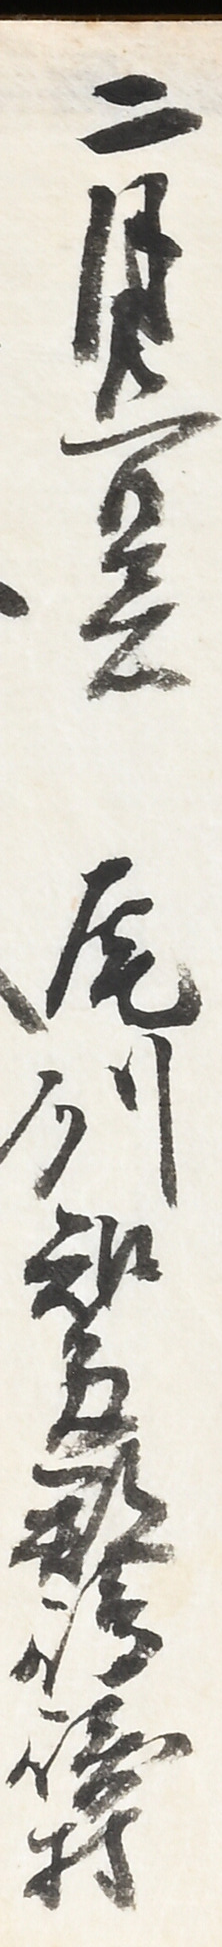二月廿一日着尾州知多郡嶋崎村
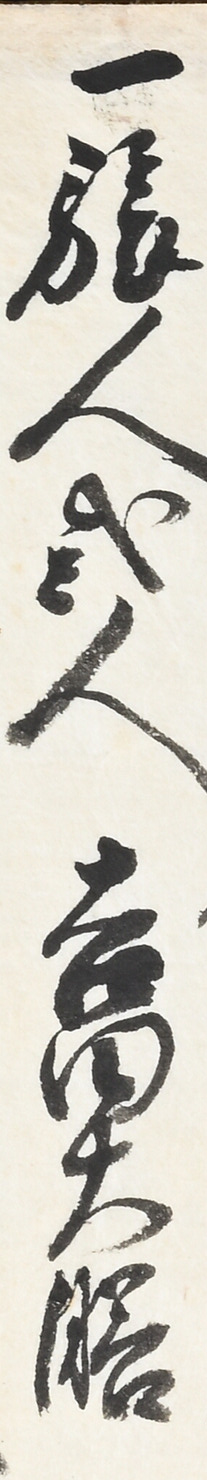一旅人弐人吉田大膳
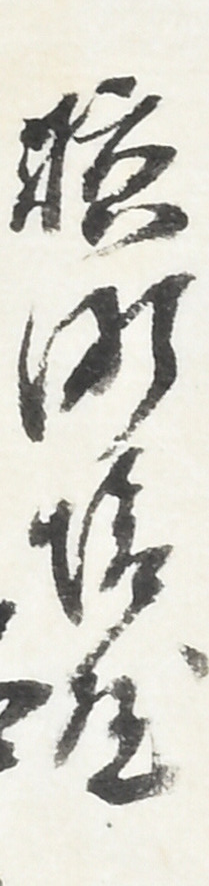横町塩屋
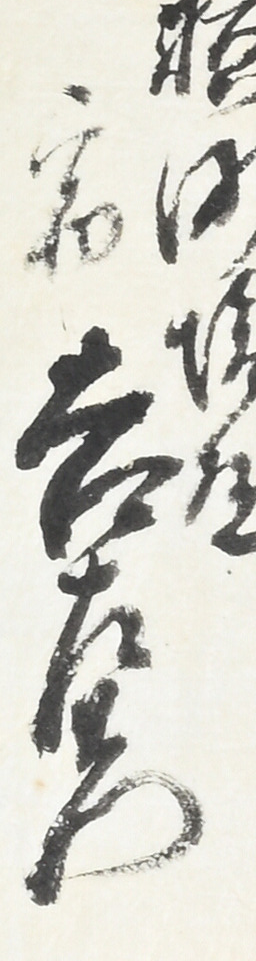宿吉左衛門

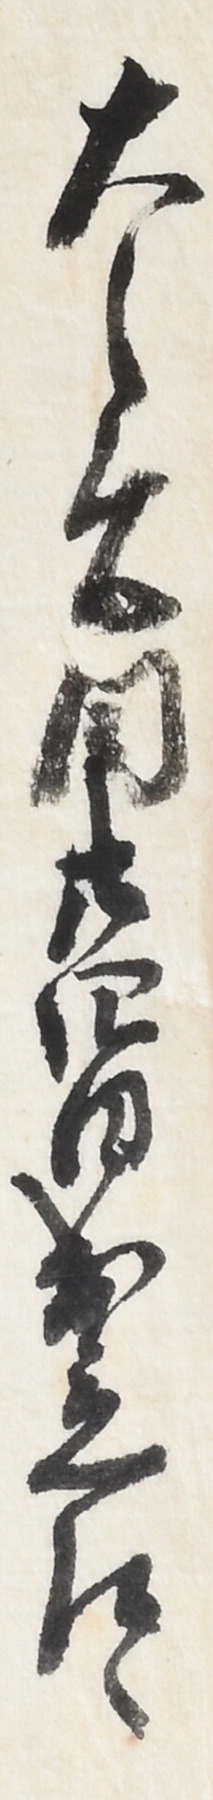右之者同廿四日出立仕候
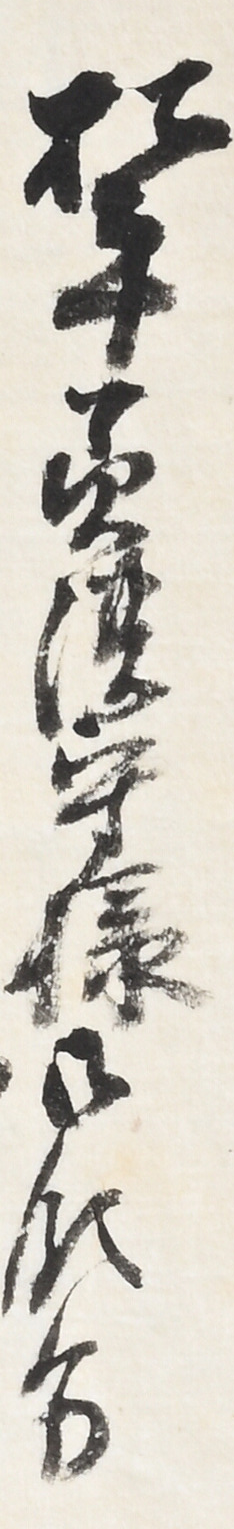松平美濃守様御領分
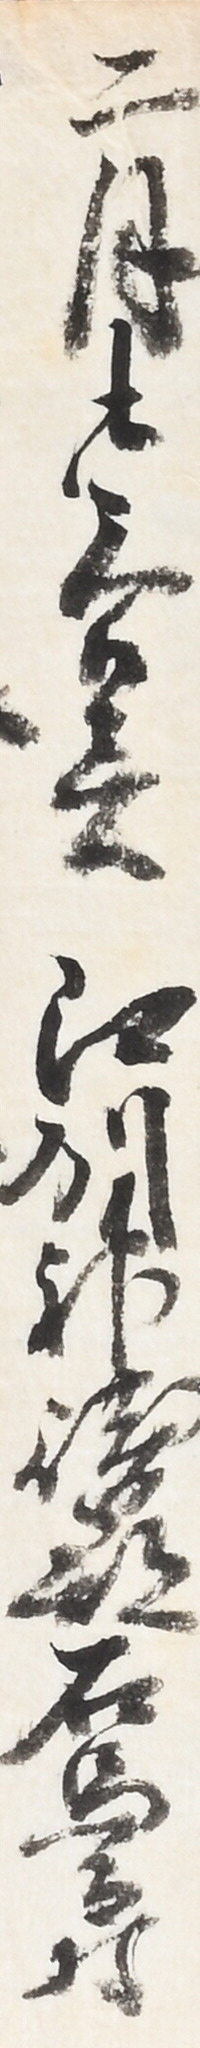二月廿三日着江州神崎郡石馬寺村
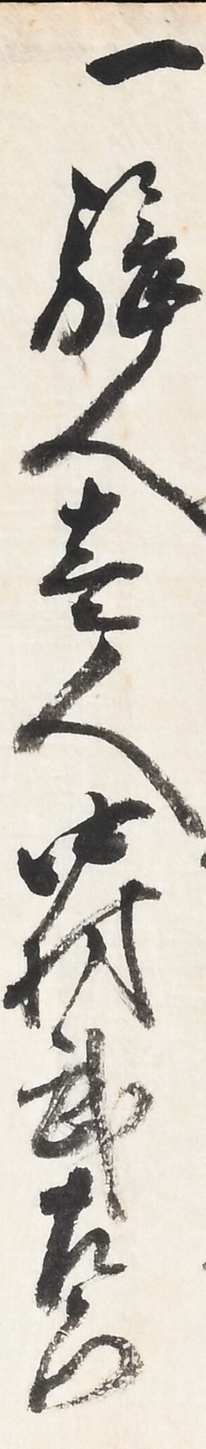一旅人壱人中村武左衛門
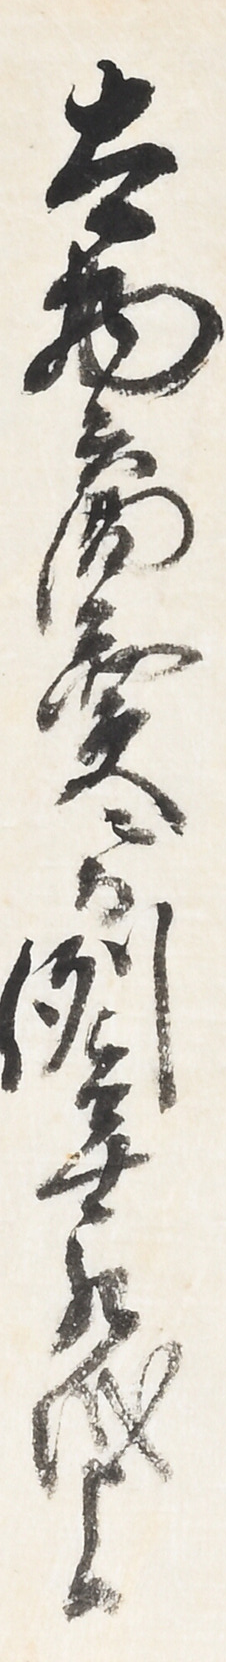太物商売ニ而例年罷越申候
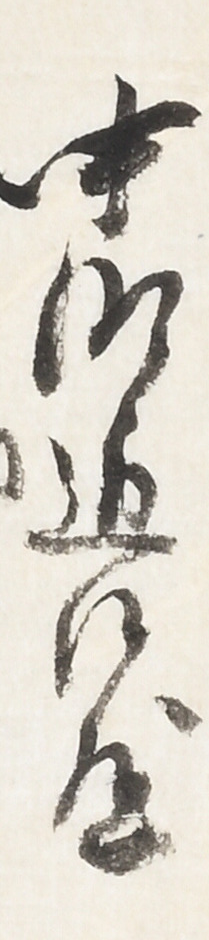中町近江屋
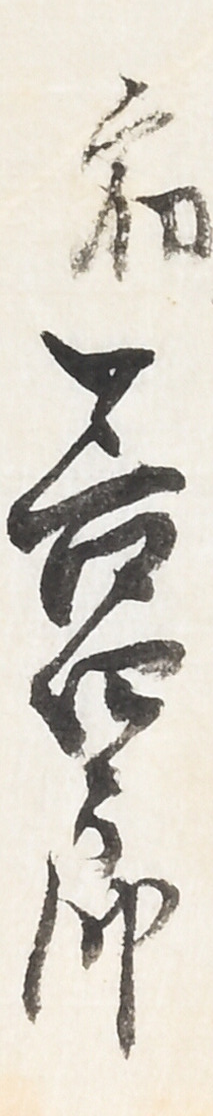宿善四郎
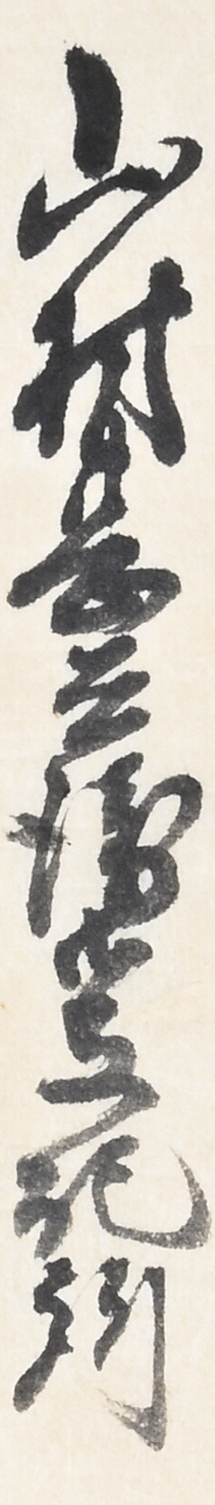山村甚兵衛御支配所
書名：旅人泊控帳
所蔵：伊那市立高遠町図書館・合同会社AMANE
